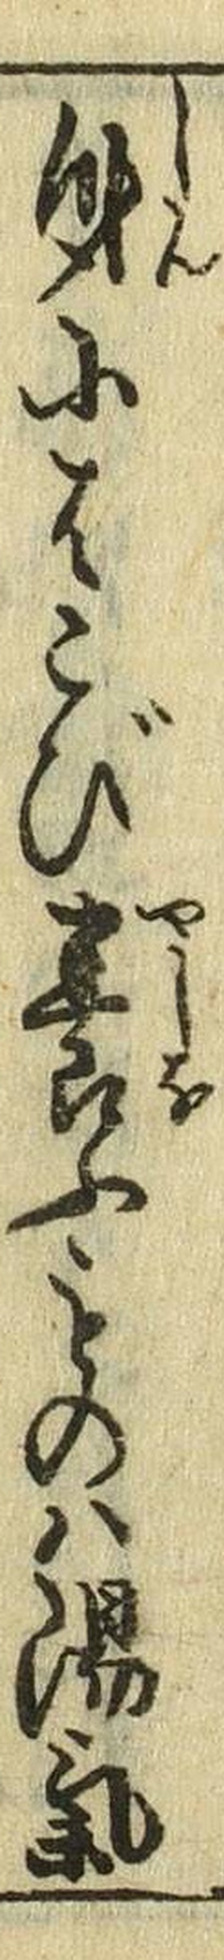身にはこび養ふものは陽気
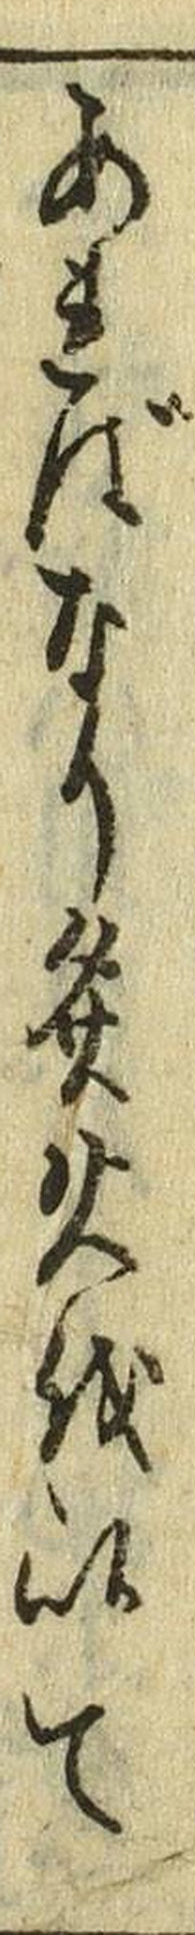あればなり灸火を以て
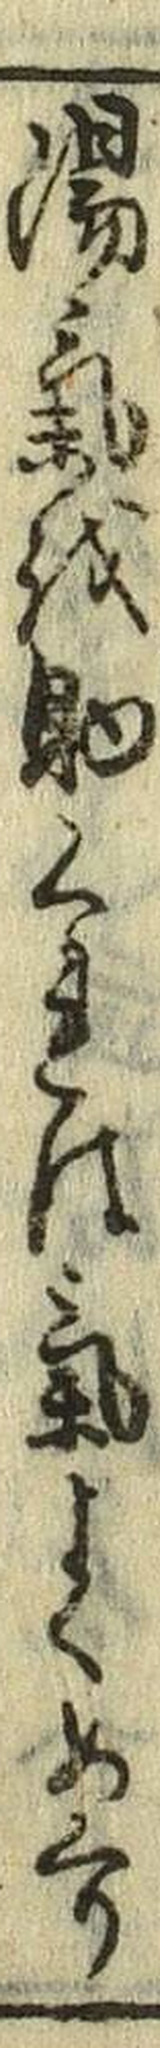陽気を助くれは気よくめくり
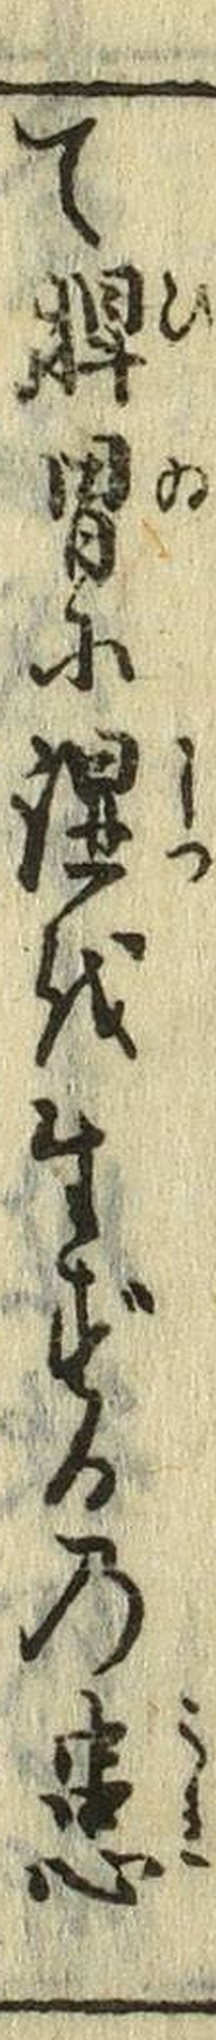て脾胃に湿を生ずるの患
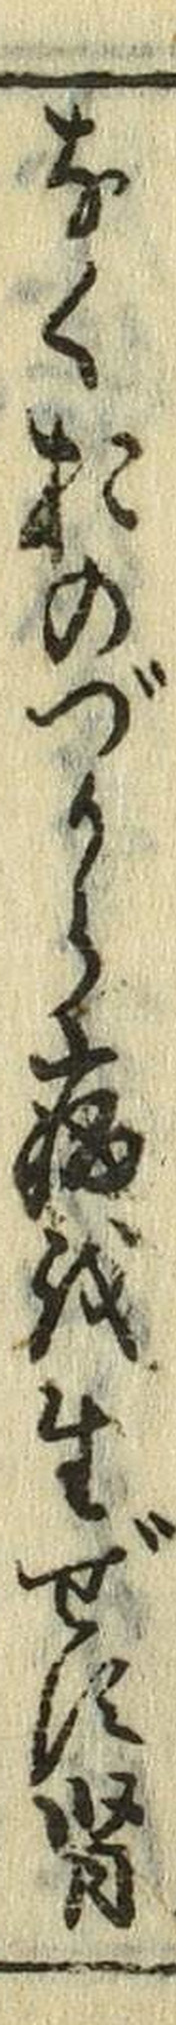なくおのづから病を生ぜす腎
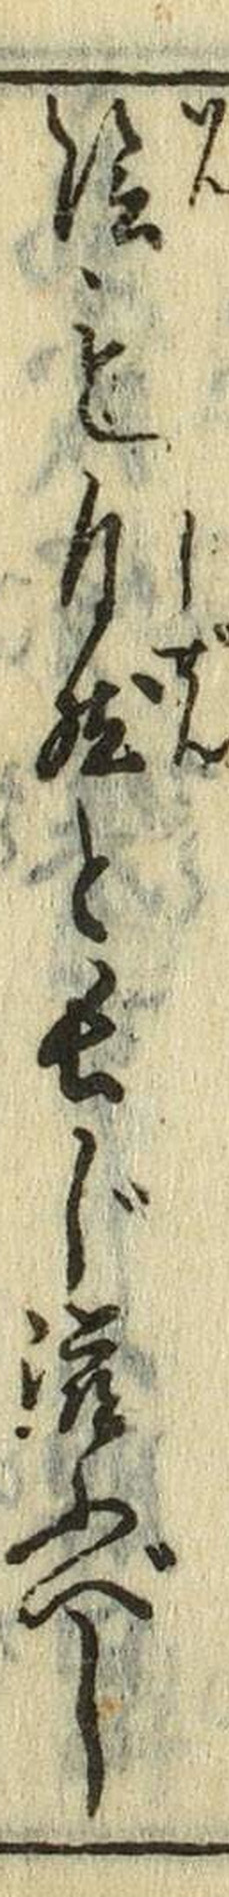陰も自然と長じ滋ふべし
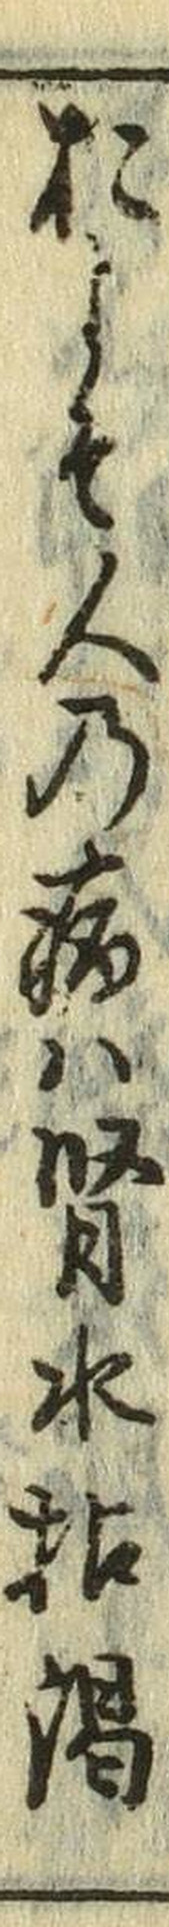およそ人の病は腎水枯渇
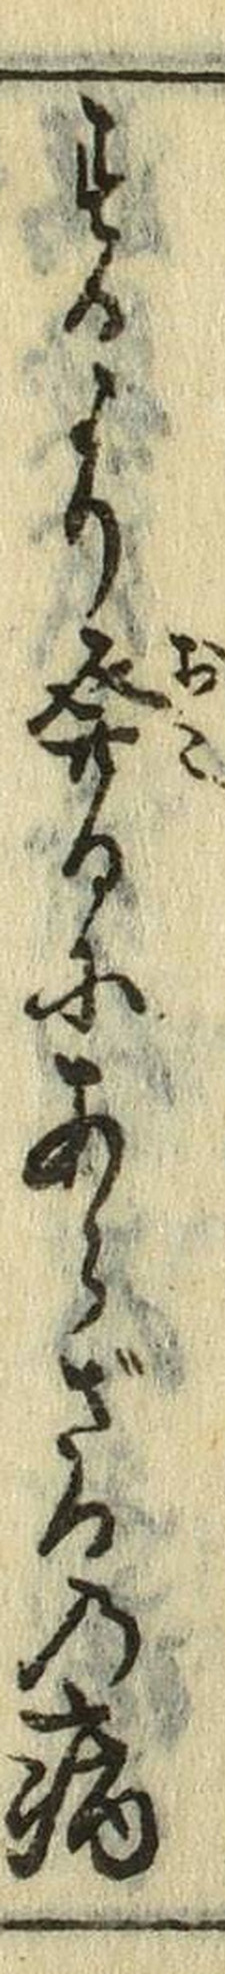するより発るにあらざるの病
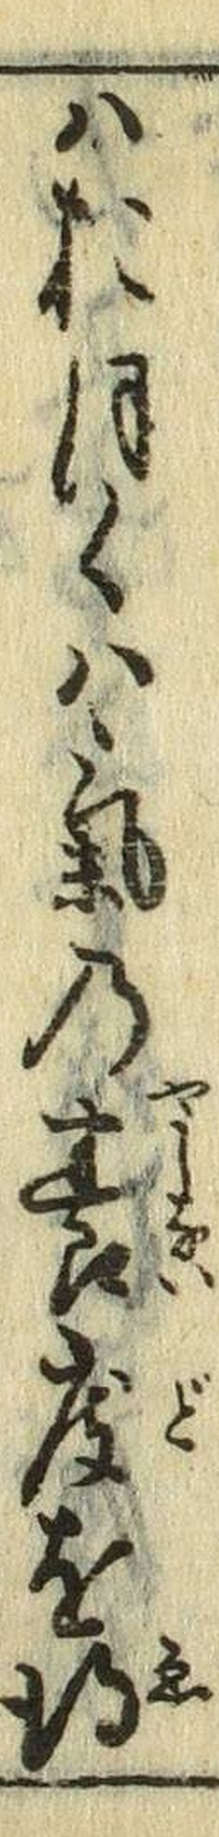はおほくは気の養度を得
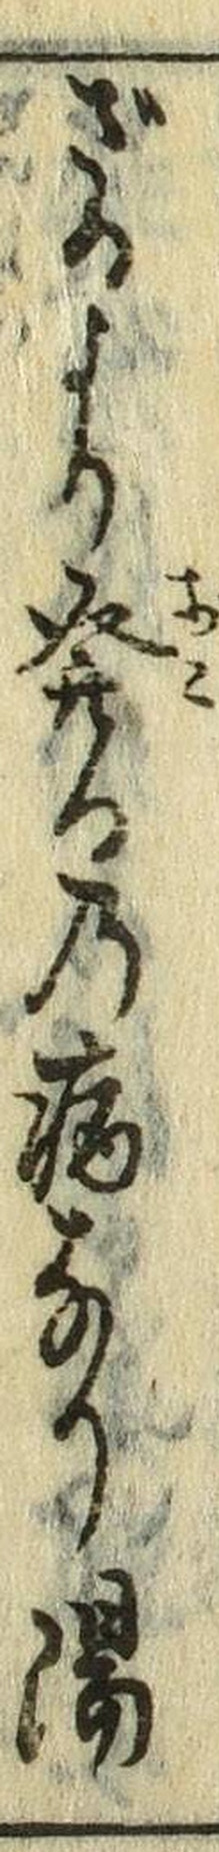ざるより発るの病なり陽
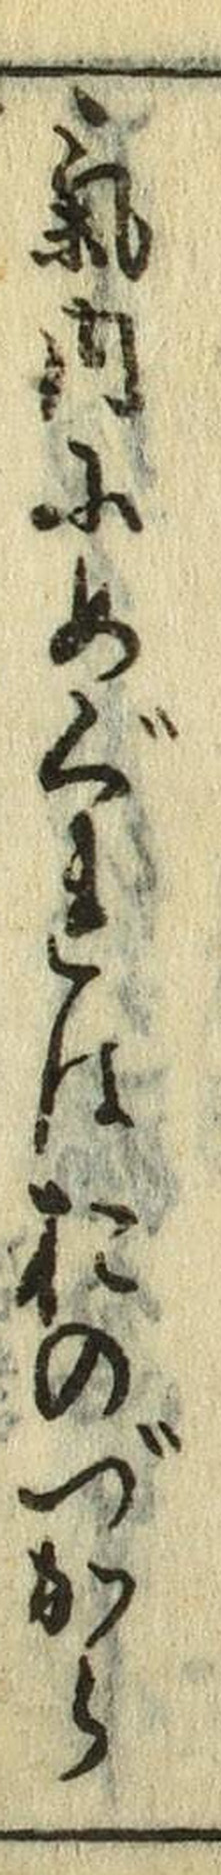気内にめぐれはおのづから
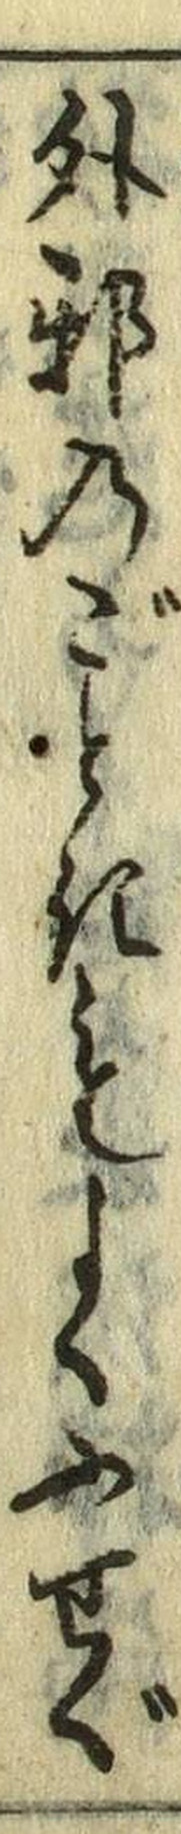外邪のごときもよくふせぐ
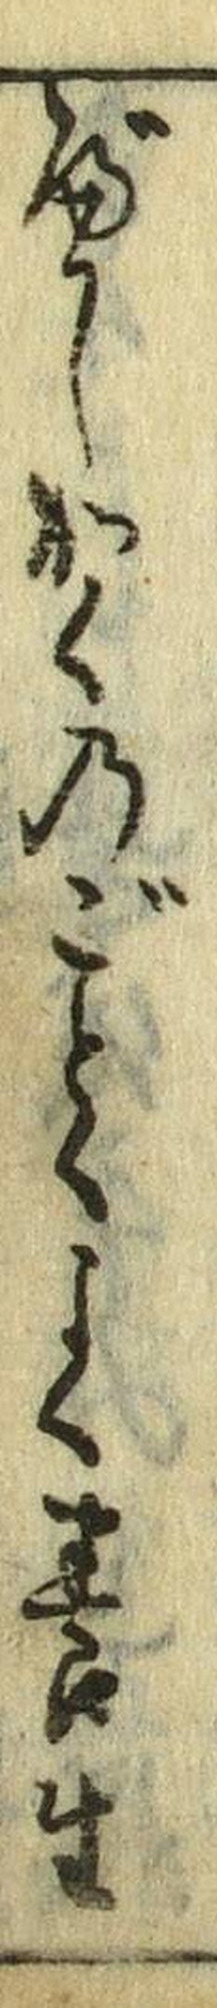べしかくのごとくよく養生

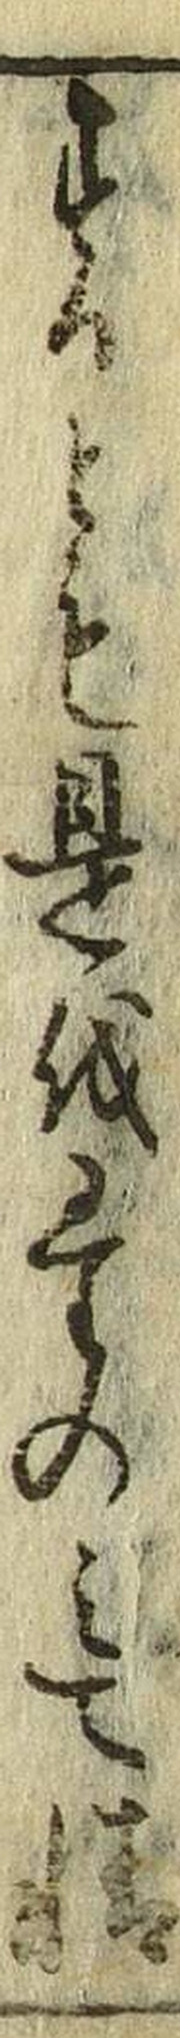するとも是をたのみて情
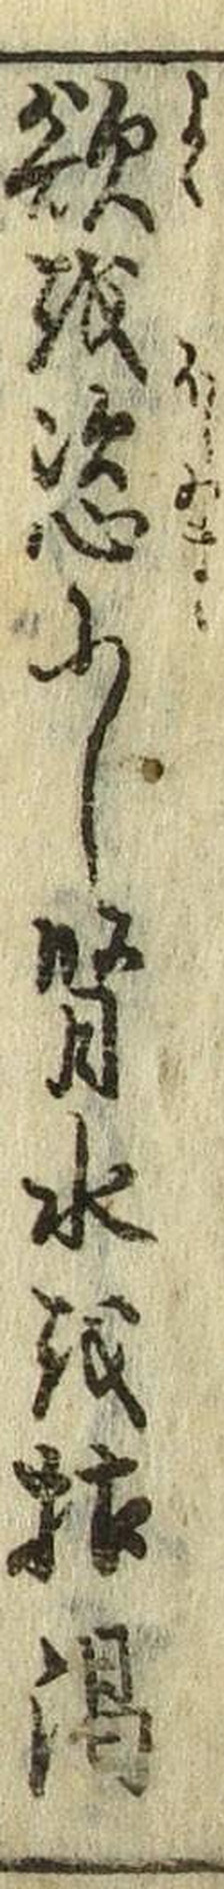欲を恣にし腎水を枯渇
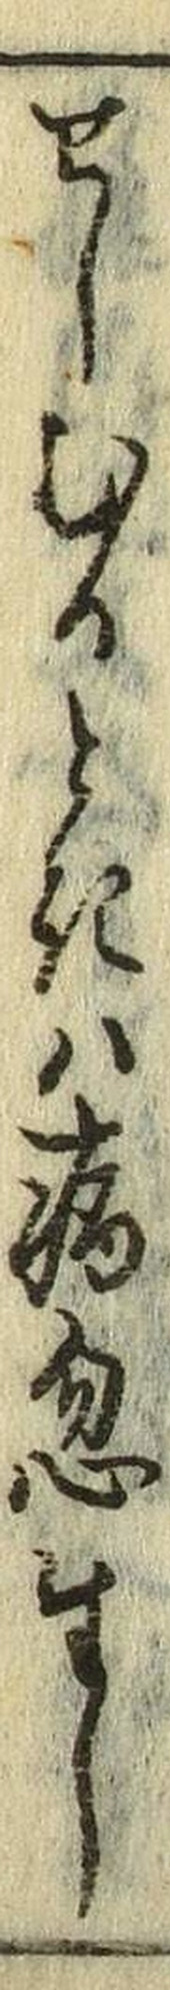せしむるときは病忽生し
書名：居家養生記
